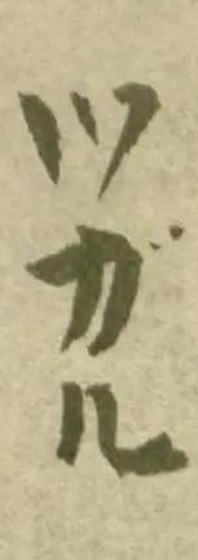ツガル
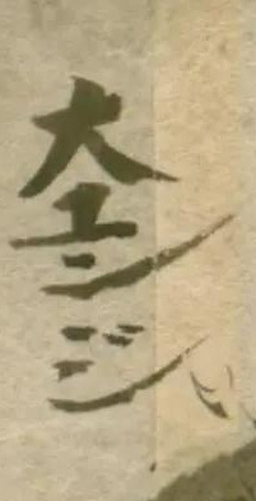大エンジ

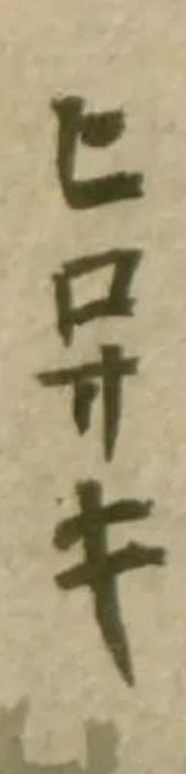ヒロサキ
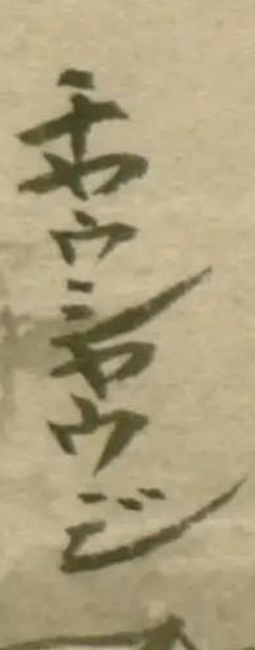チヤウシヤウジ
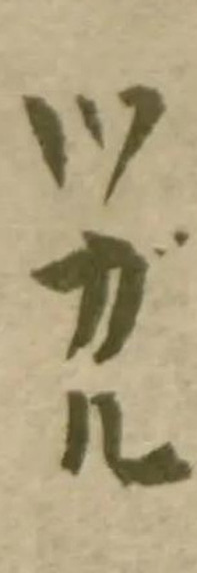ツガル
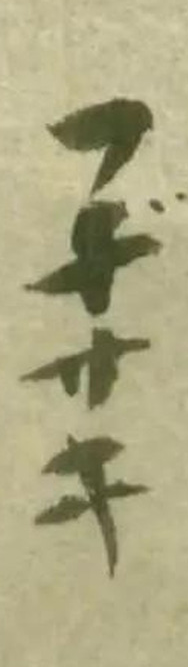フヂサキ
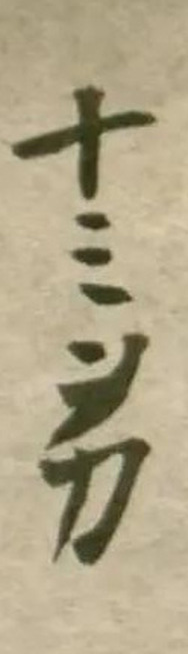ナミヲカ

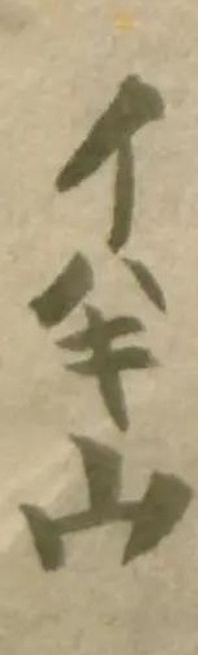イハキ山
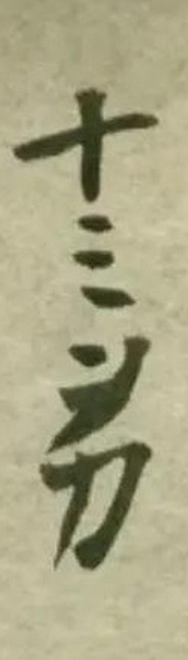ナミヲカ

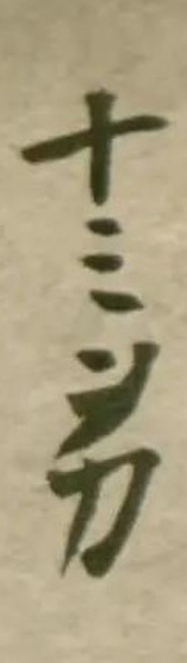ナミヲカ
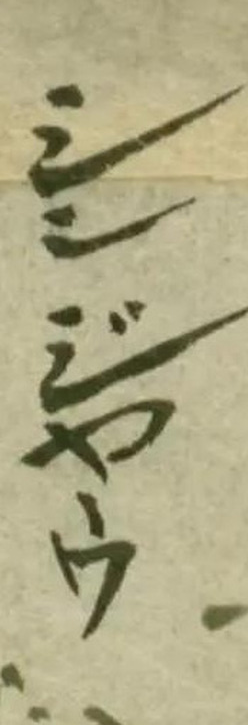シンジヤウ
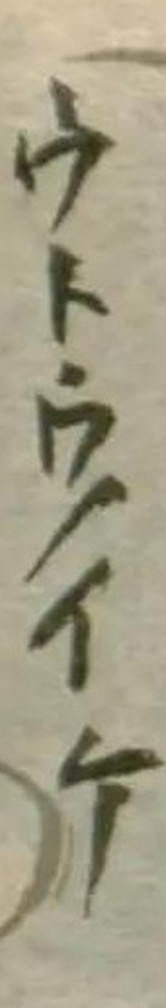ウトウノイケ

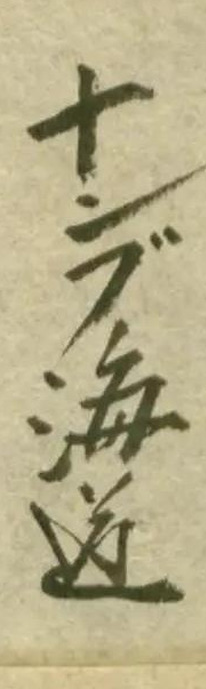ナンブ海道
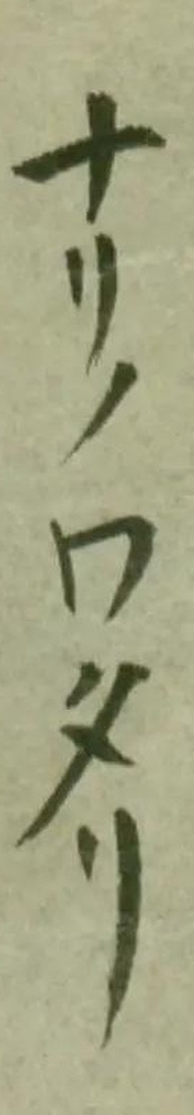十リノワタリ
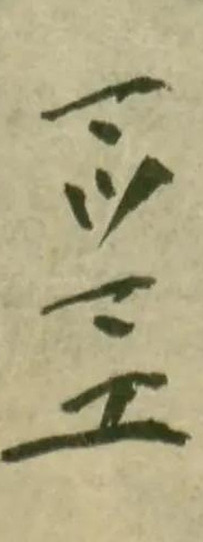マツマエ
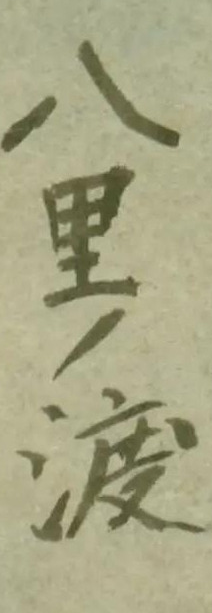八里ノ渡
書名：江戸より奥州津輕迄道筋之圖
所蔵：国立国会図書館 National Diet Library, JAPAN
